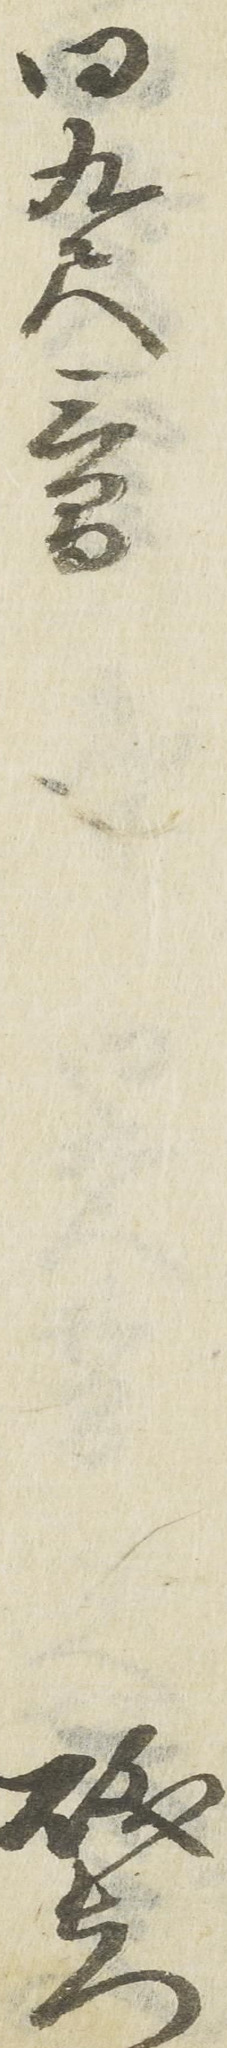同九尺三間磯右衛門
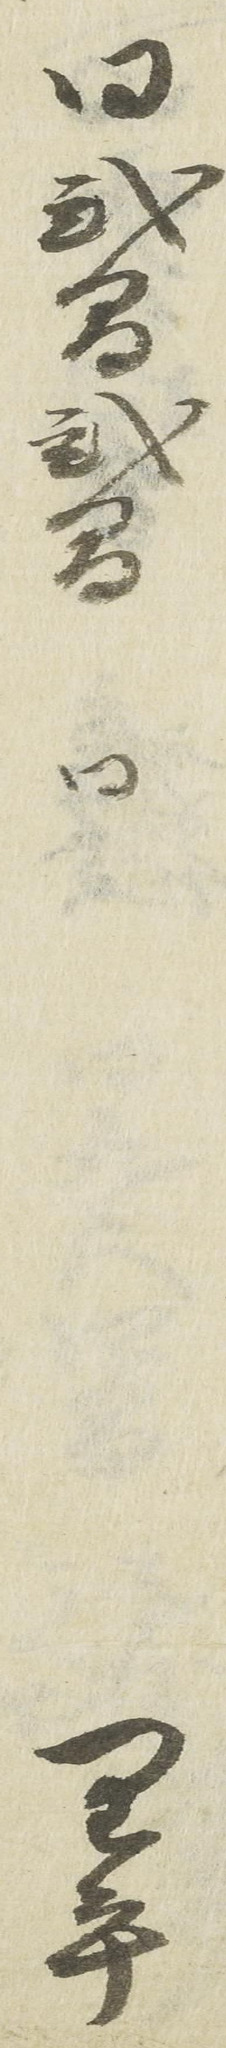同弐間弐間同里平
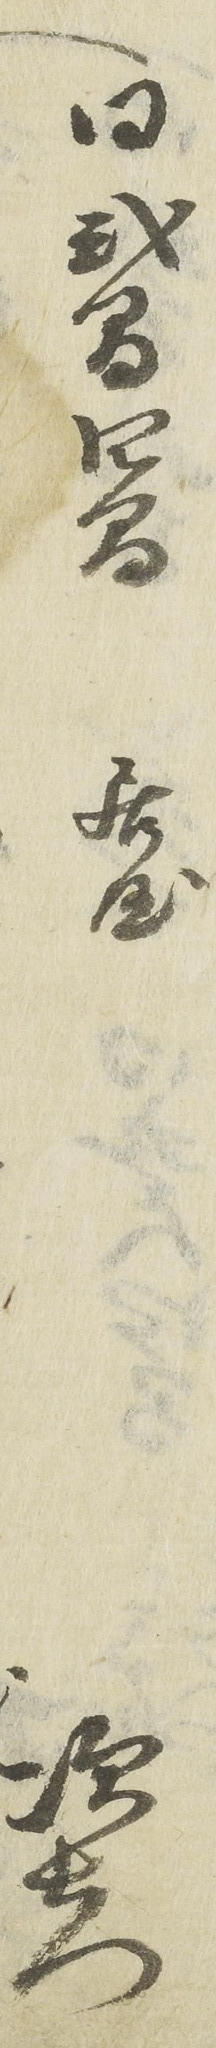同弐間四間居屋次右衛門

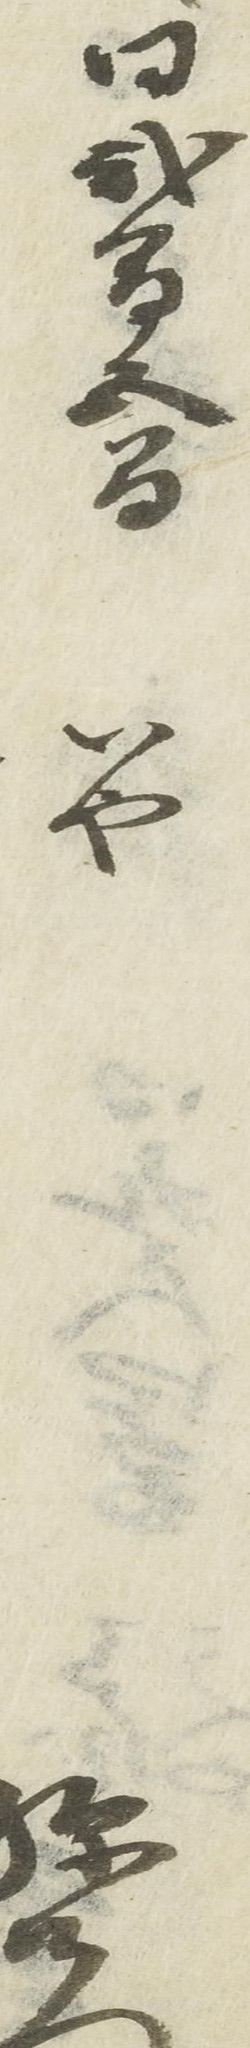同弐間五間いや孫右衛門
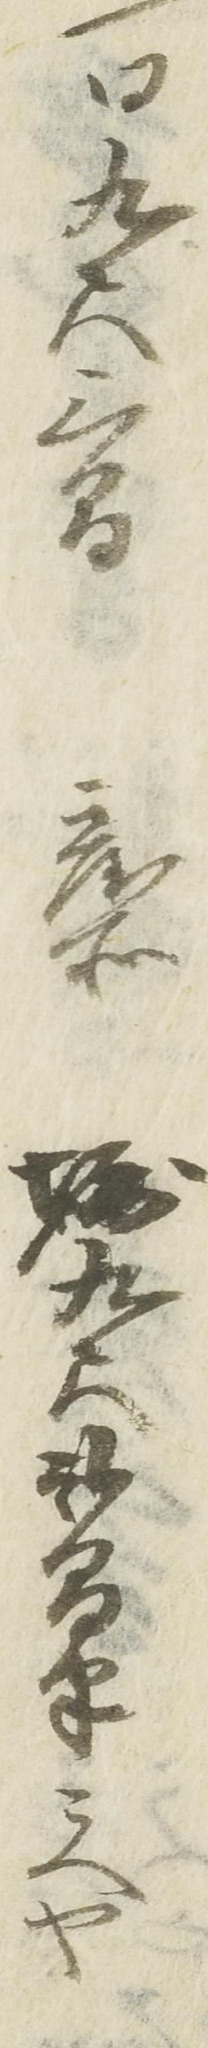同九尺三間台所堀九尺弐間半こへや
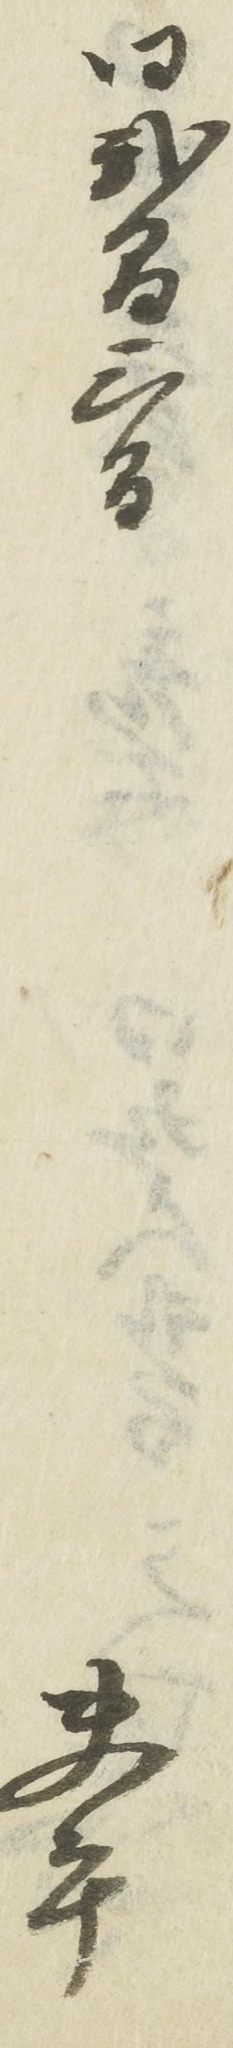同弐間三間夫平
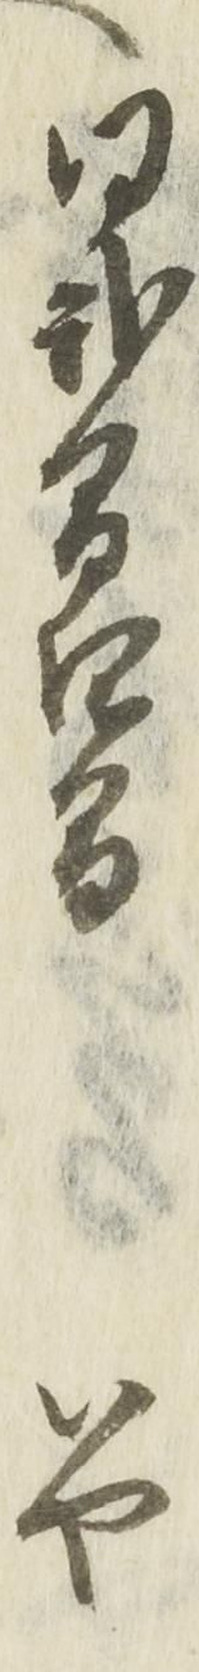同弐間四間居や
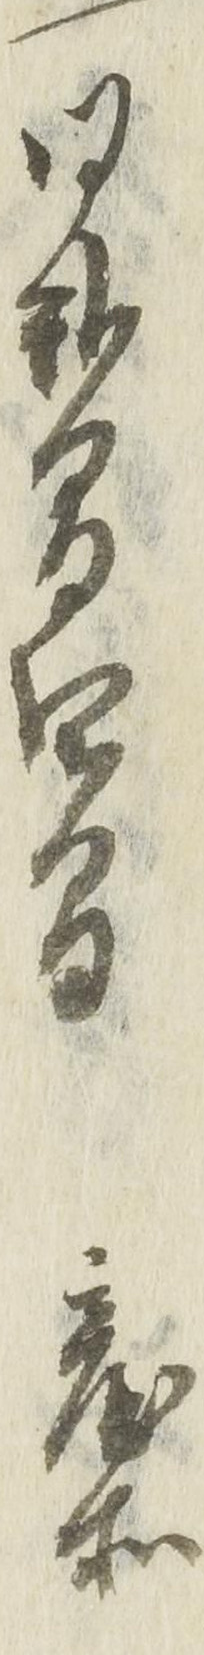同弐間四間居や
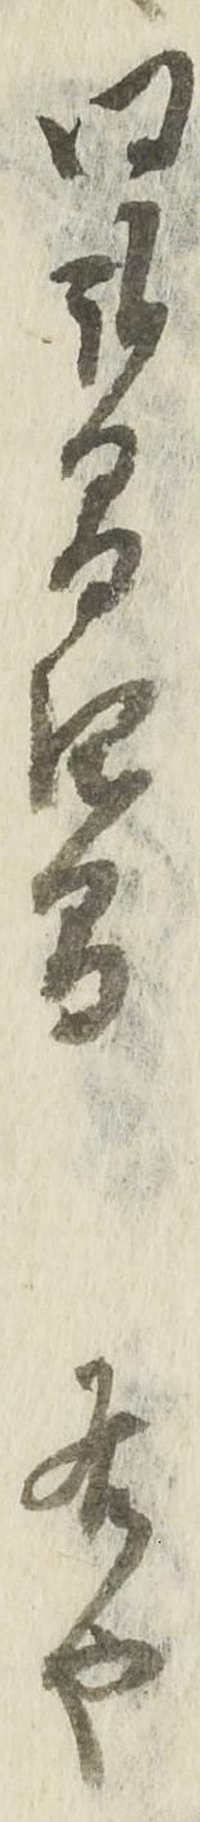同弐間四間居や
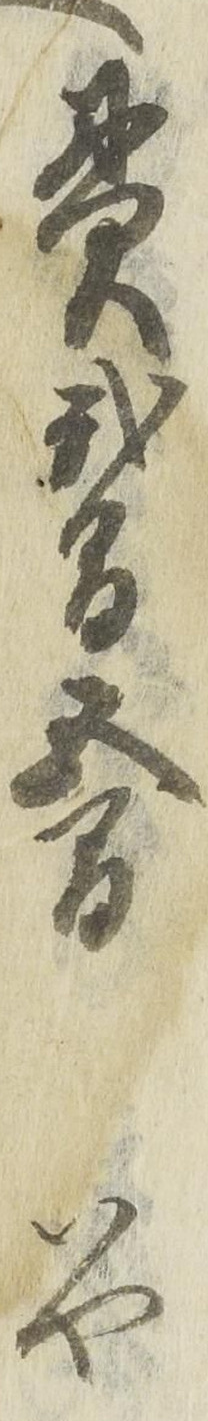貫弐間五間いや

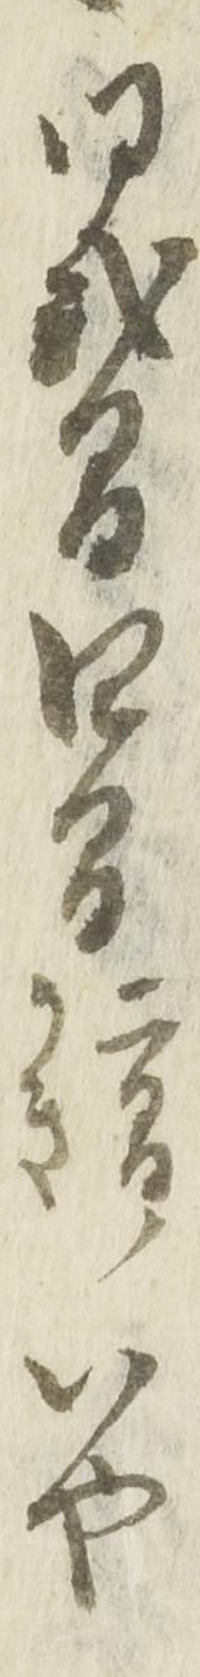貫弐間四間いや
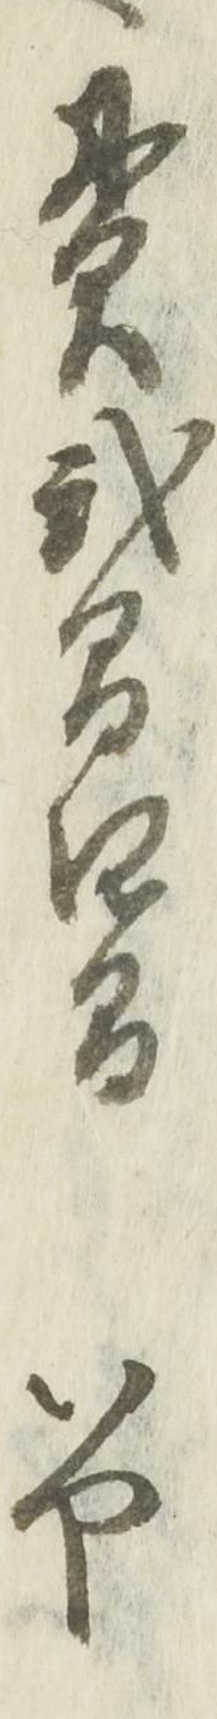貫弐間四間いや
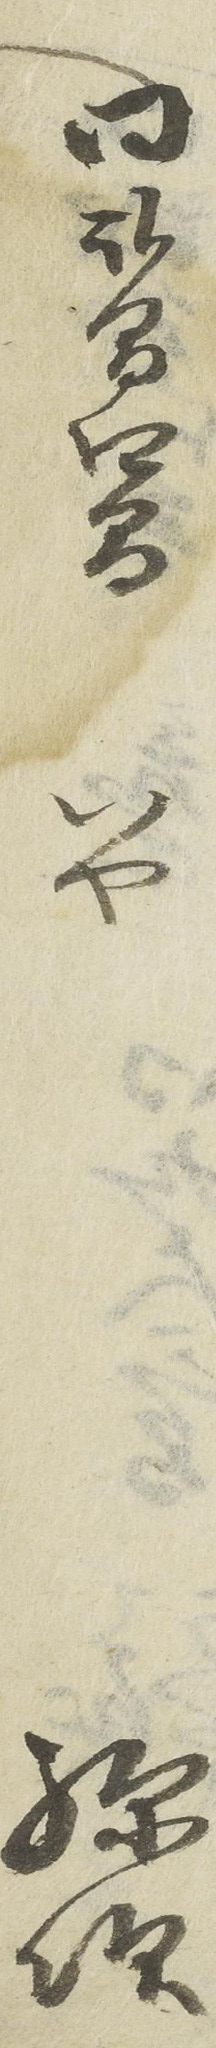同弐間四間いや源次

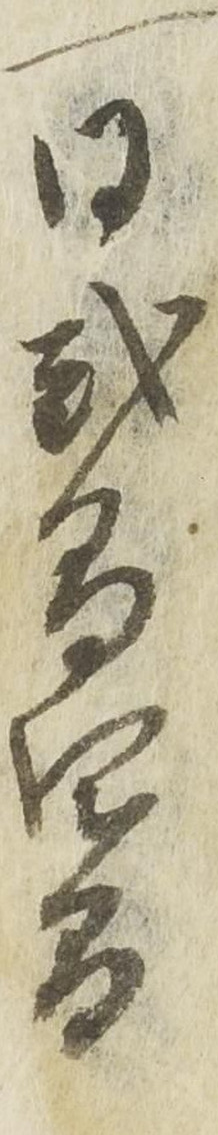同弐間四間
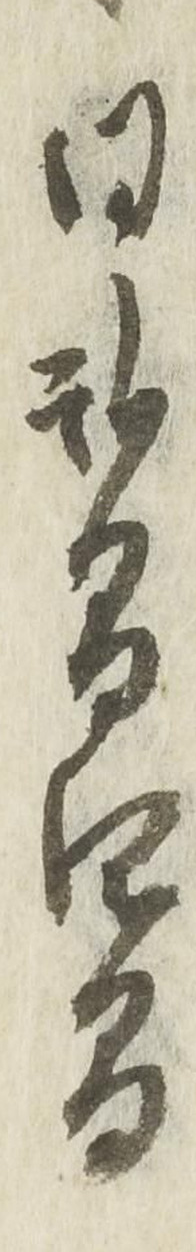同弐間四間
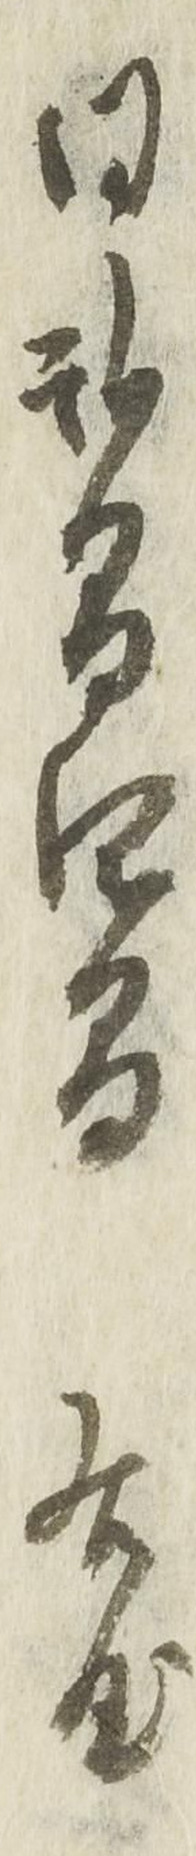同弐間四間居屋
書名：後見笑
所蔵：東京大学地震研究所図書室 Earthquake Research Institute Library, The University of Tokyo, JAPAN
